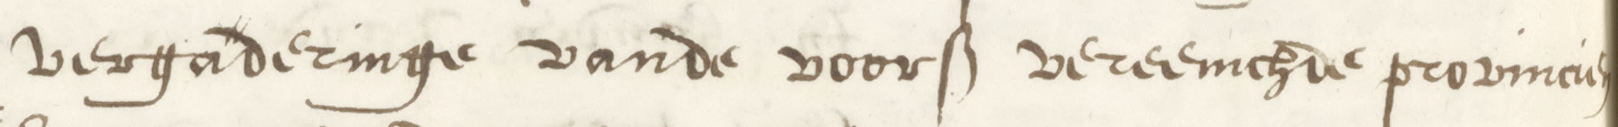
vergaderinge vande voors vereenichde provincien
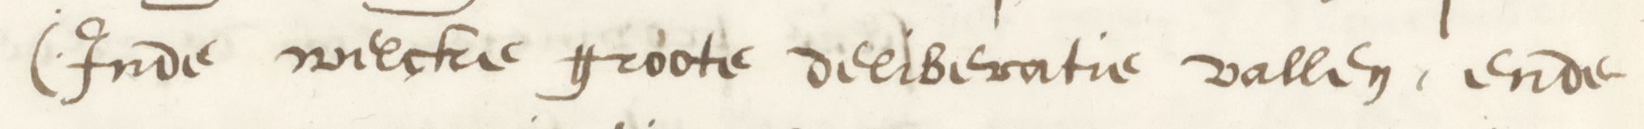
(.Inde welcke groote deliberatie vallen, ende
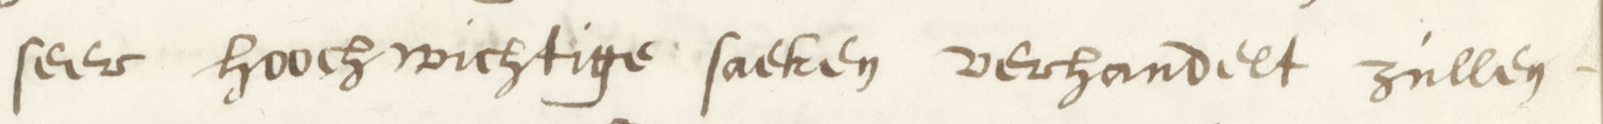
seer hoochwichtige saecken verhandelt zullen
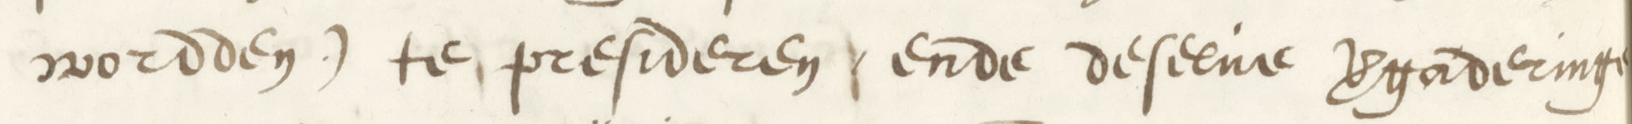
wordden.) te presideren, ende deselue vgaderinge
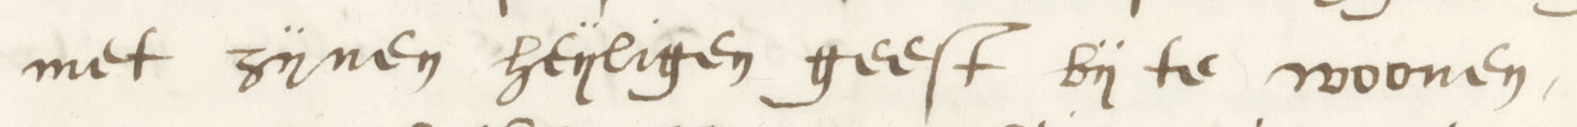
met zijnen heijligen geest bij te woonen,
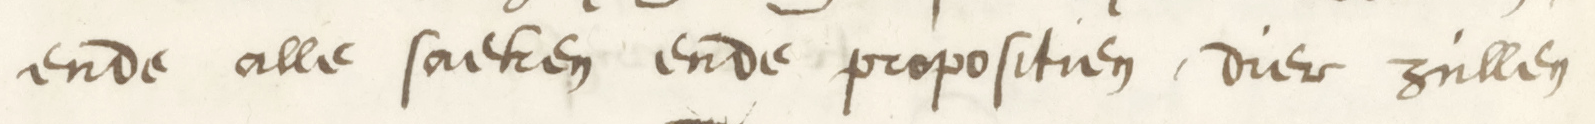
ende alle saecken ende propositien, dier zullen
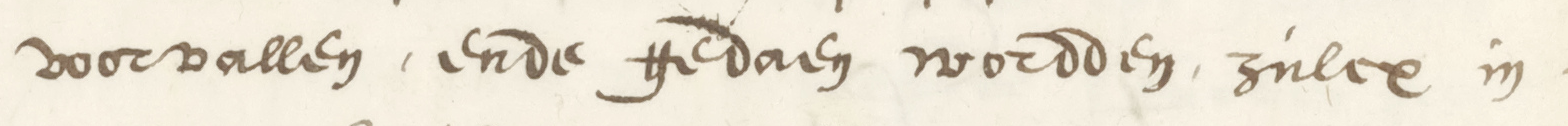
voorvallen, ende gedaen wordden, zulcx in
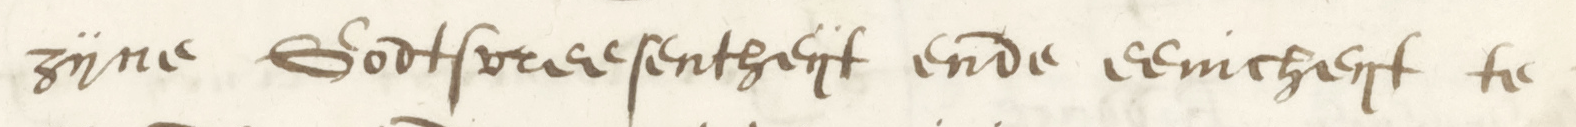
zijne Godtsvreesentheijt ende eenicheyt te
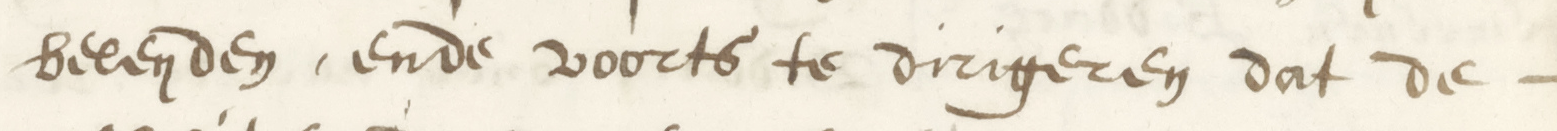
beleyden, ende voorts te dirigeren dat de
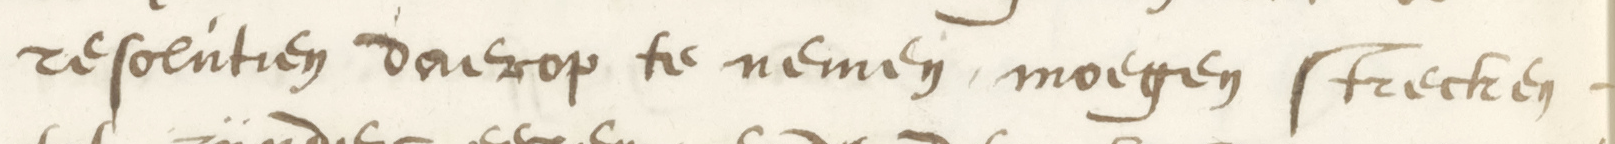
resolutien daerop te nemen, moegen strecken
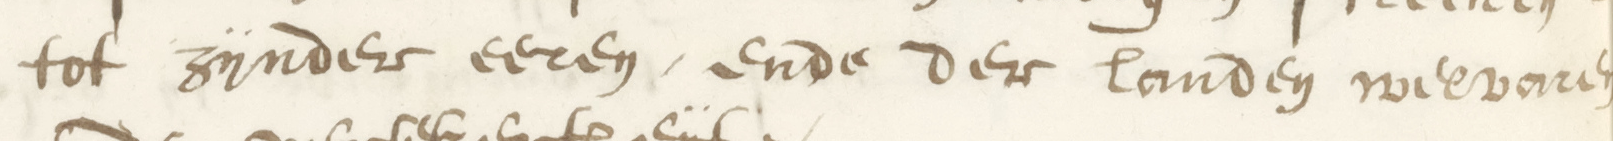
tot zijnder eeren, ende der landen welvaren
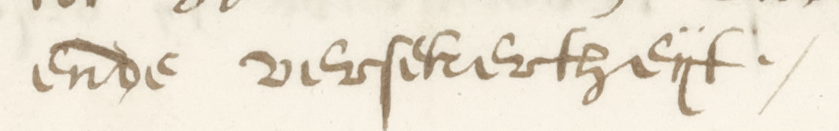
ende versekertheijt.
